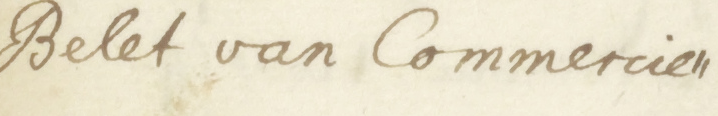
Belet van Commercien
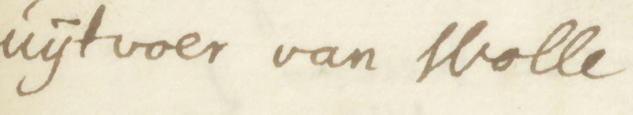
uijtvoer van Wolle
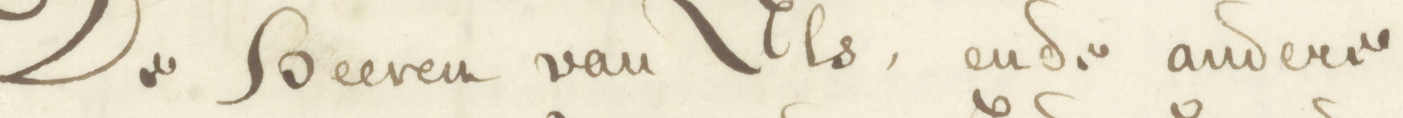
De Heeren van Els, ende andere
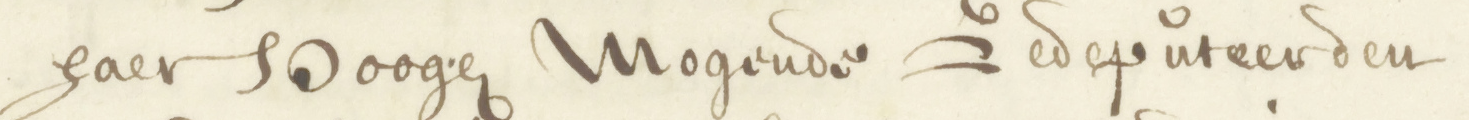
haer Hoogh Mogende Gedeputeerden
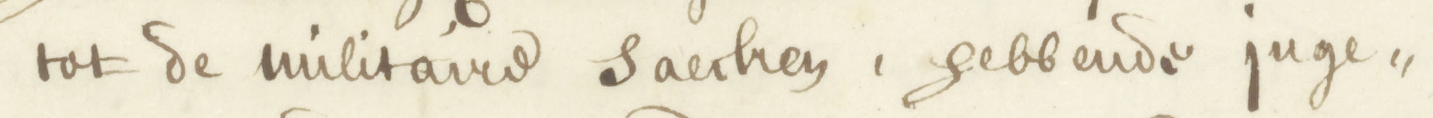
tot de militaire saecken, hebbende inge„
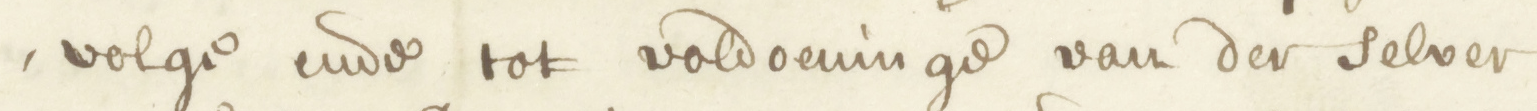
„volge ende tot voldoeninge van der selver
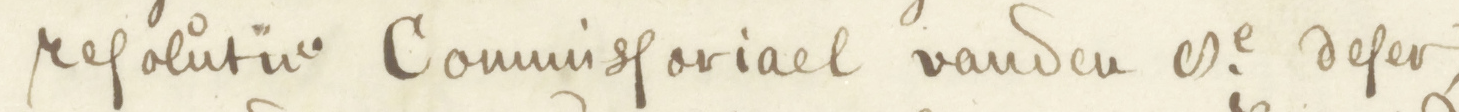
resolutie Commissoriael vanden 8e deser
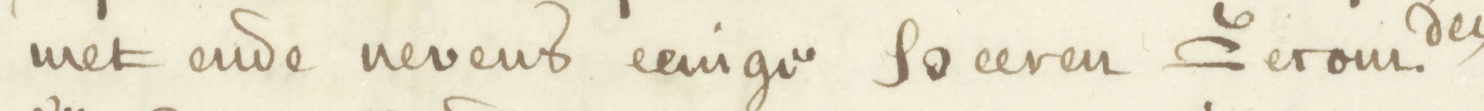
met ende nevens eenige Heeren Gecomden.
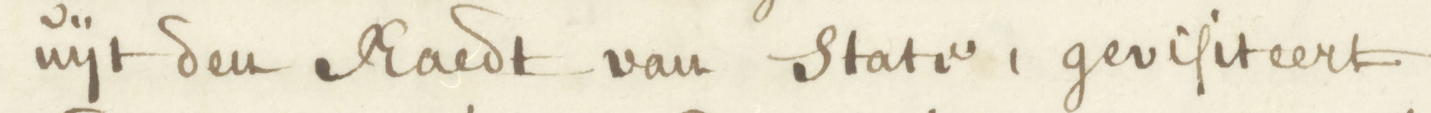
uijt den Raedt van State, gevisiteert
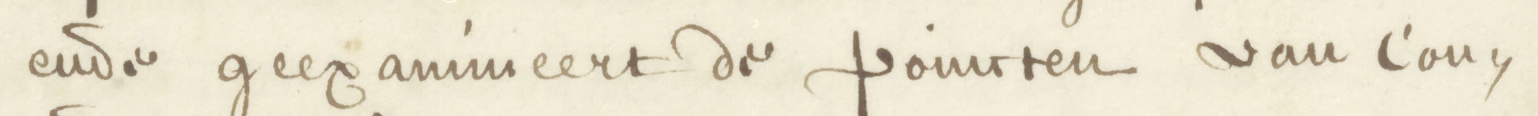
ende geexamineert de poincten van con„
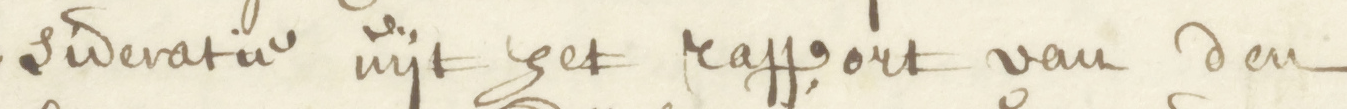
sideratie uijt het rapport van den
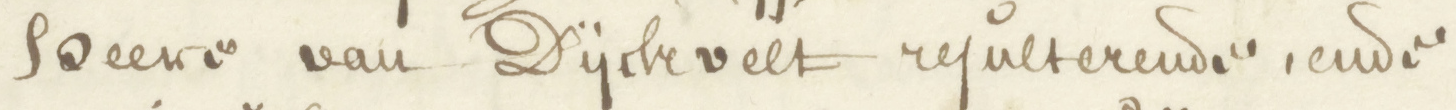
Heere van Dijckvelt resulterende, ende
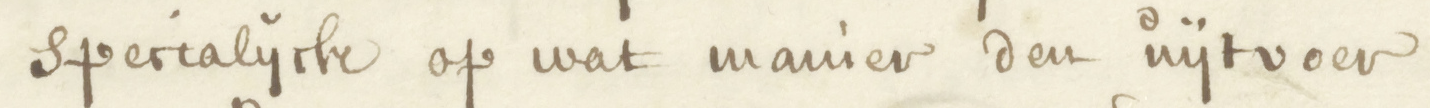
specialijck op wat manier den uijtvoer
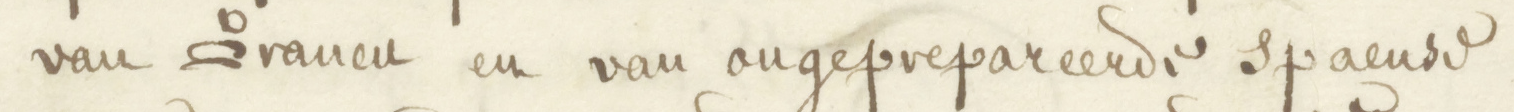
van Granen en van ongeprepareerde spaense
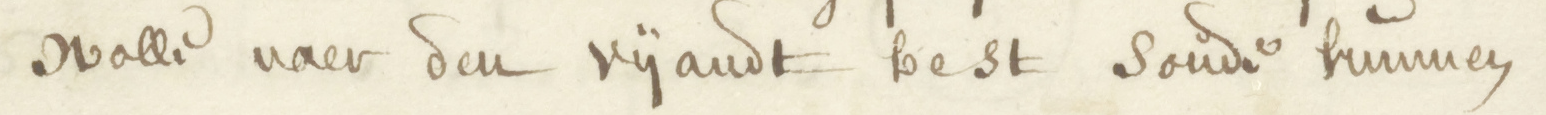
Wolle naer den vijandt best soude kunnen
